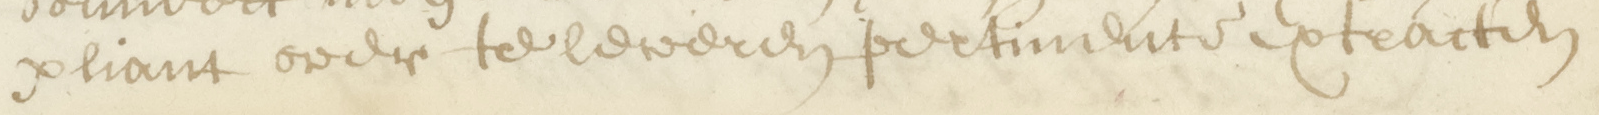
pliant over te leveren pertinente extracten
